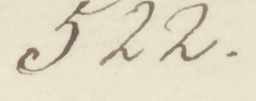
522.
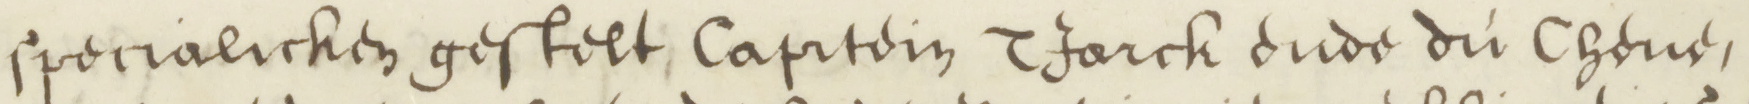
specialicken gestelt capitein Tjarck ende Du Chene.
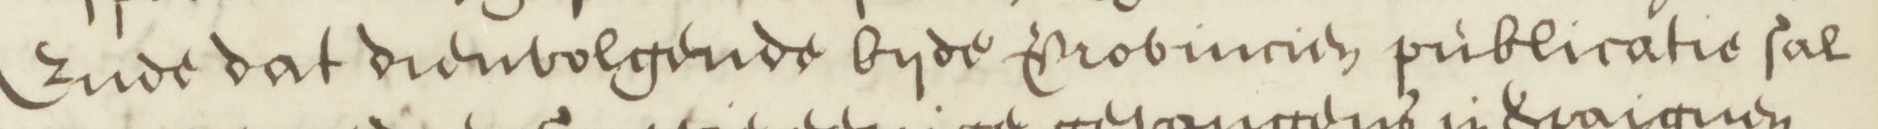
Ende dat dienvolgende bij de provincien publicatie sal
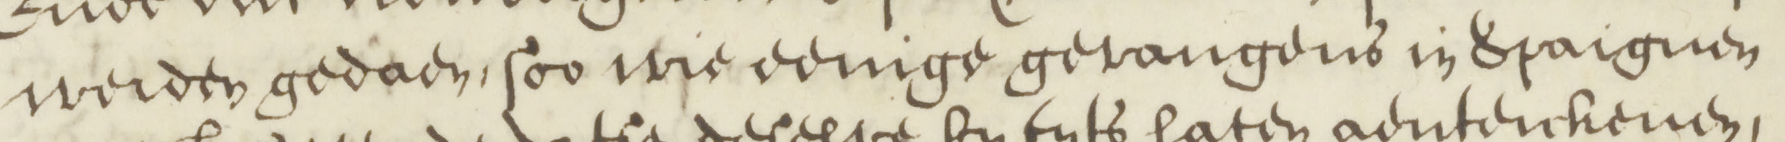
werden gedaen, soo wie eenige gevangens in Spaignen
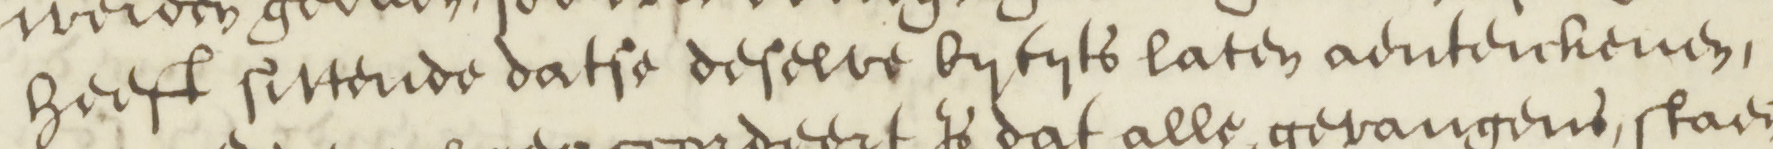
heeft sittende datse deselve bytyts laten aenteickenen.
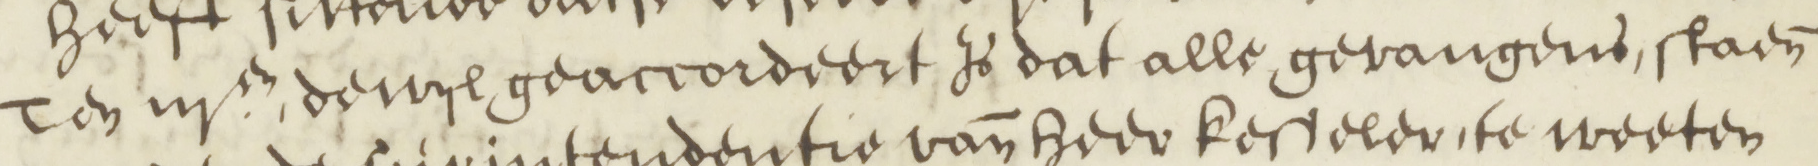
Ten iijen dewyl geaccordeert is dat alle gevangens, staen
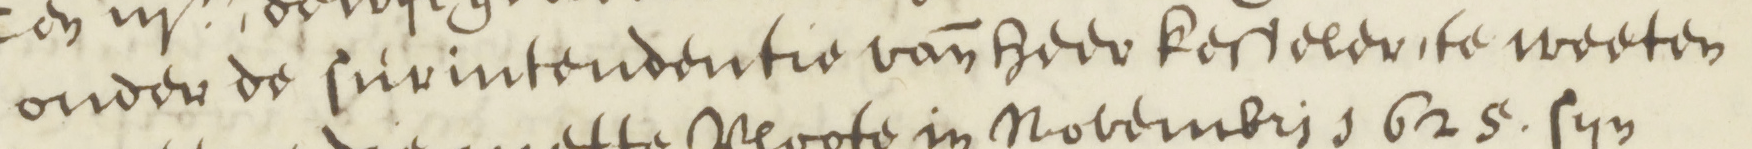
onder de surintendentie van heer Kesseler, te weeten
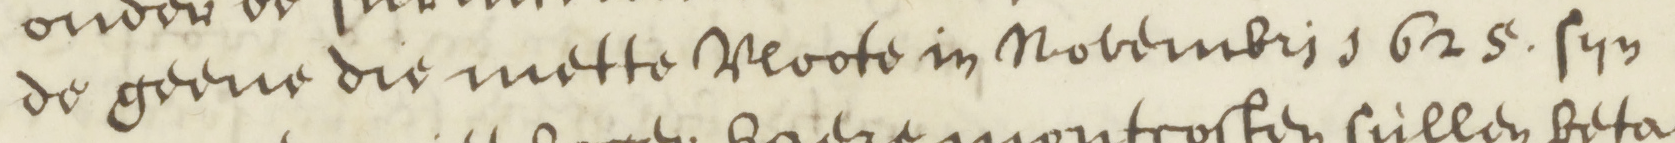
de geene die mette Vloote in Novembris 1625 syn
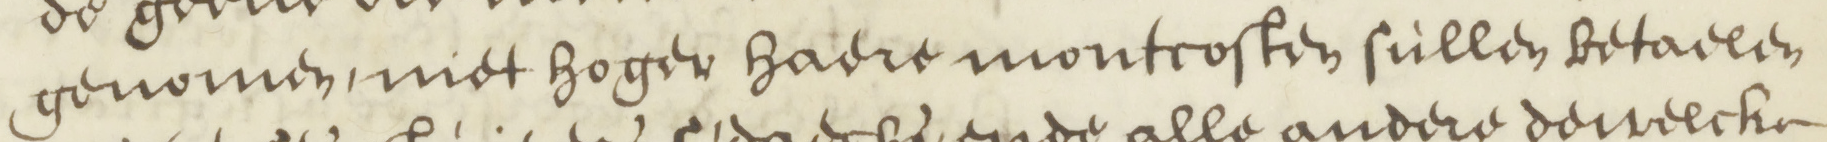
genomen, niet hoger haere montcosten sullen betaelen
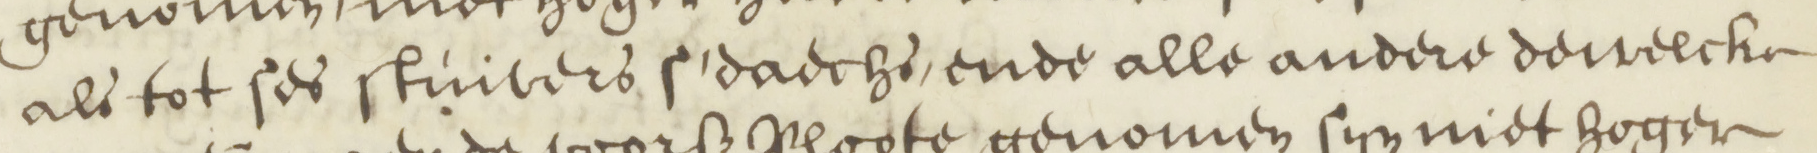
als tot ses stuivers s'daechs, ende alle andere dewelcke
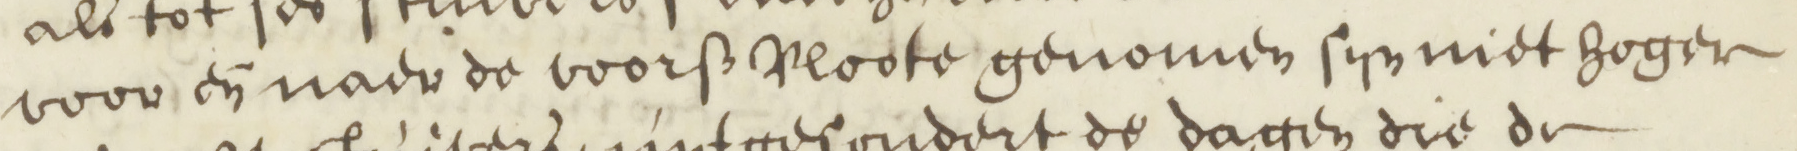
voor en naer de voors Vloote genomen syn niet hoger
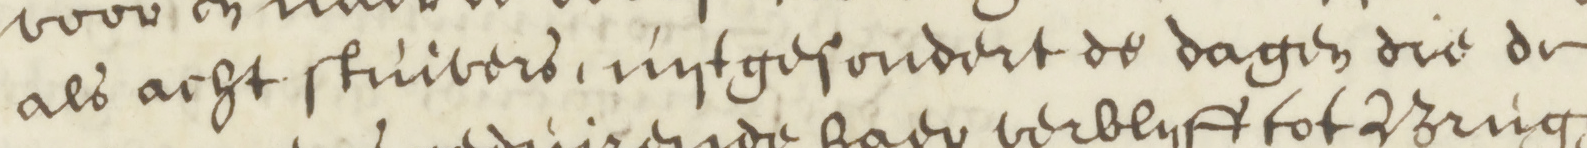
als acht stuivers, uytgesondert de dagen die de
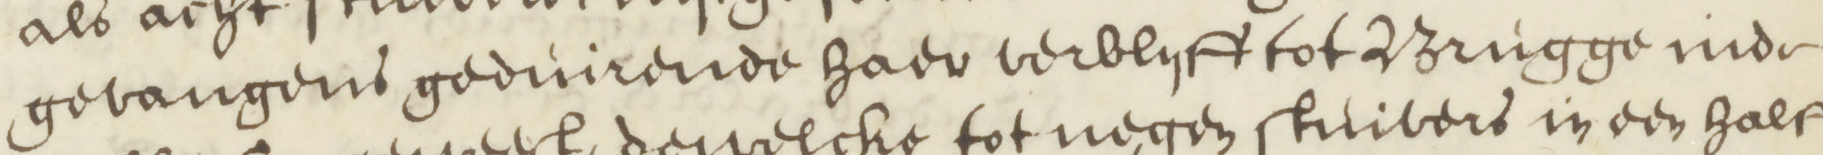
gevangens geduirende haer verblyff tot Brugge inde
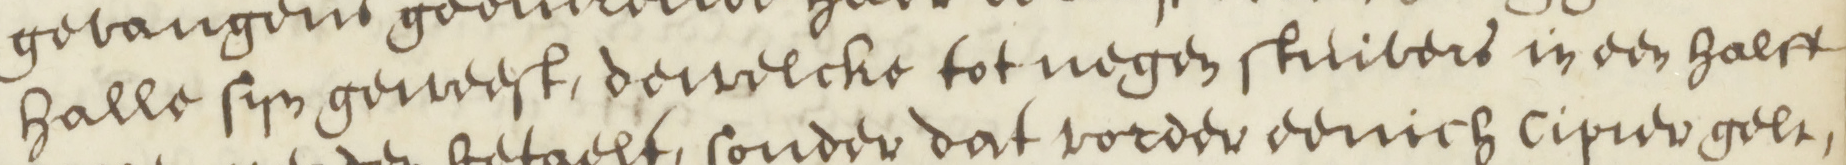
halle syn geweest, dewelcke tot negen stuivers in een halft
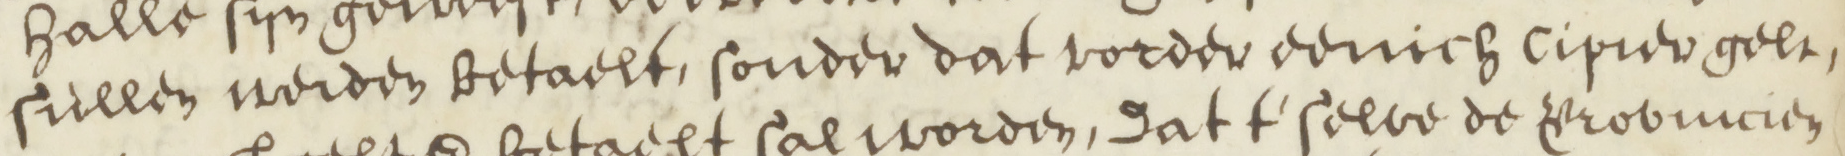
sullen werden betaelt, sonder dat vorder eenich cipier gelt,
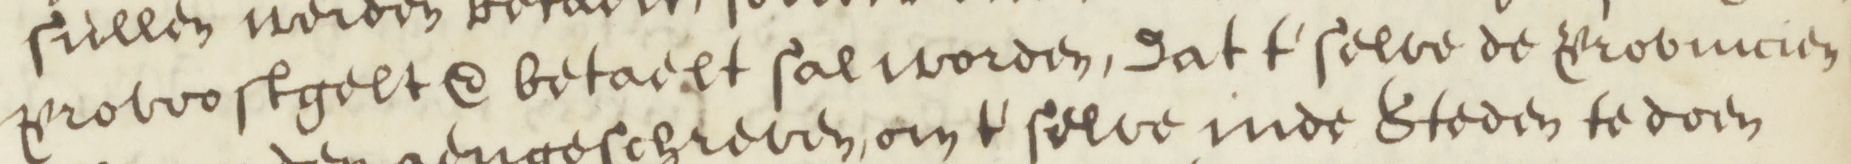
provoostgelt @ betaelt sal worden, dat 't selve de provincien
